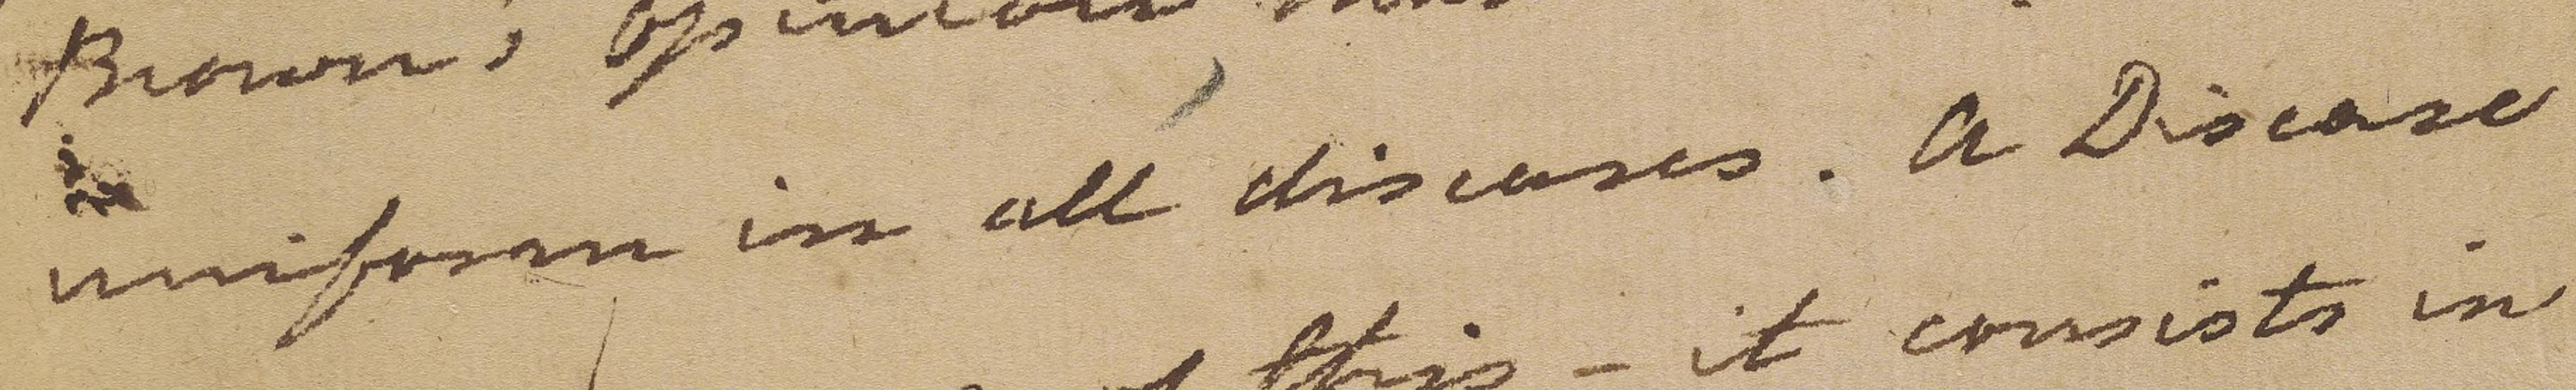uniform in all diseases. A Disease
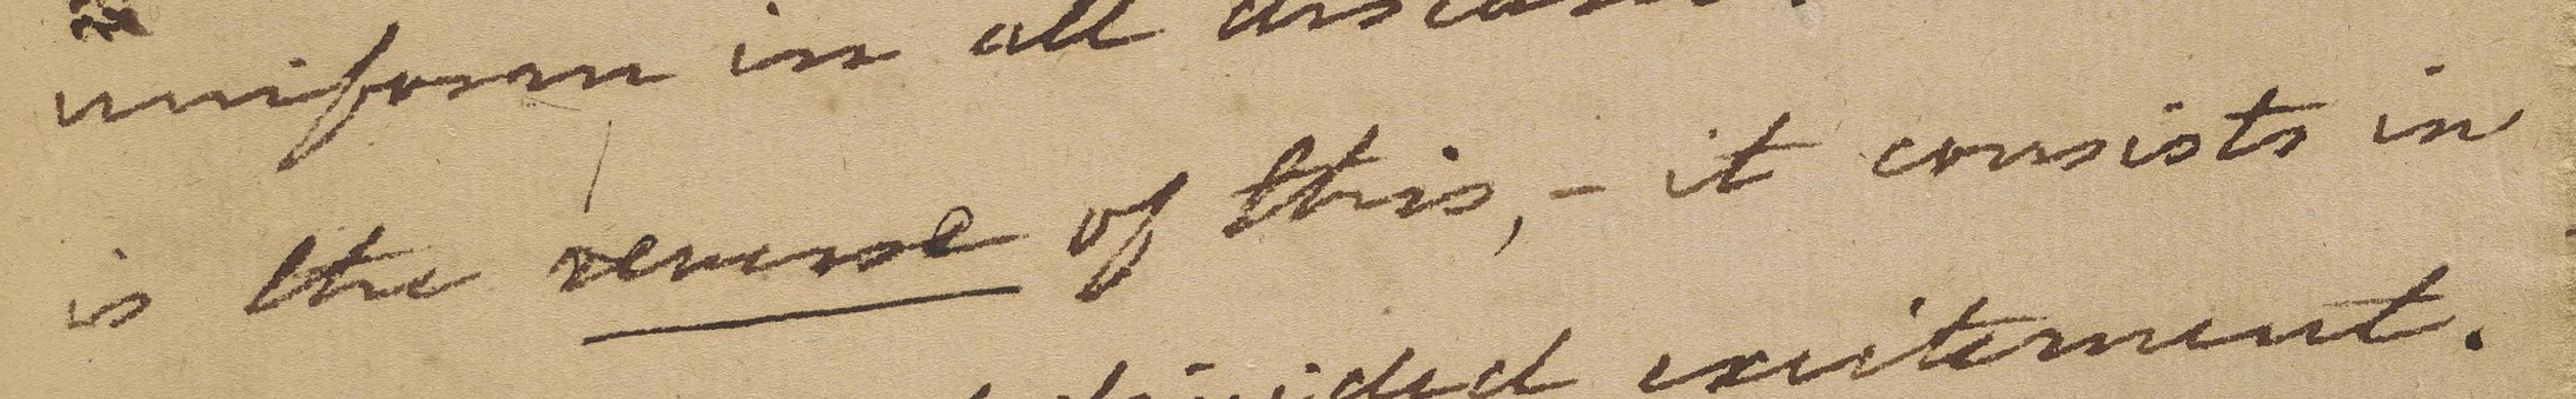is the reverse of this, it consists in
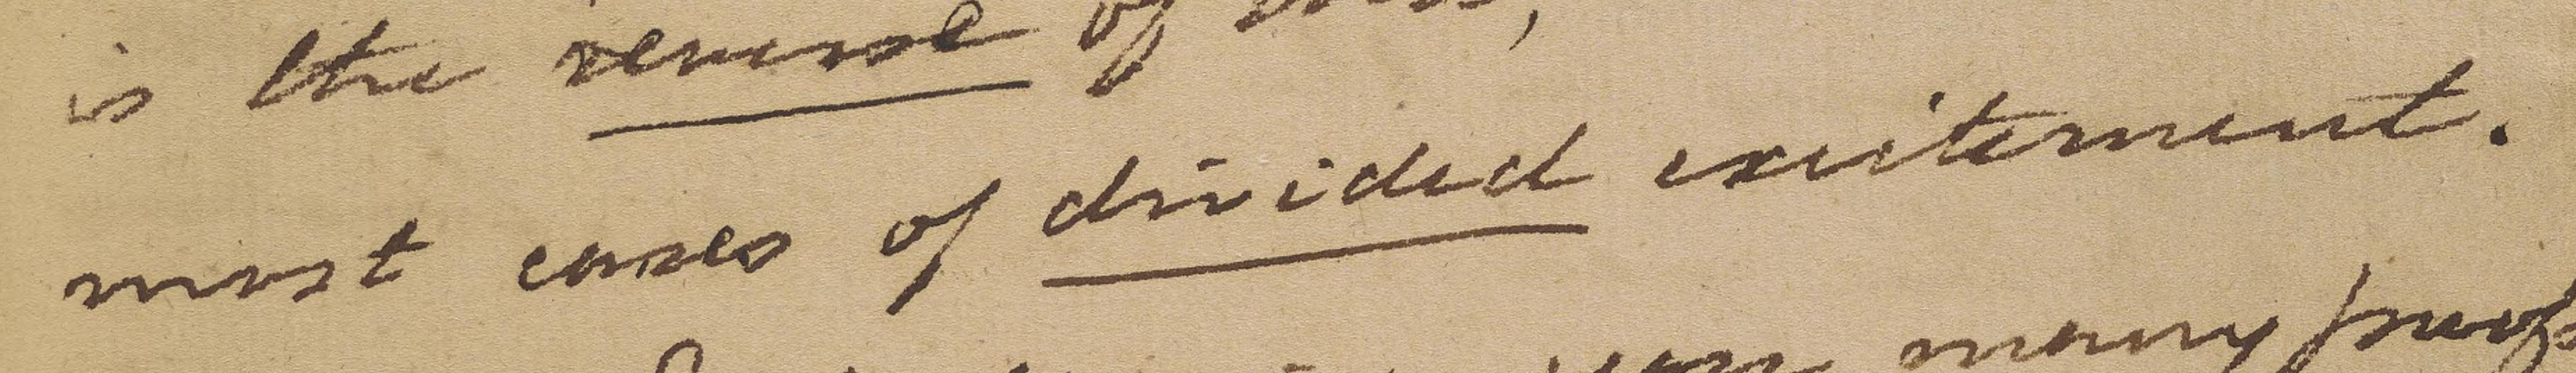most cases of divided excitement.
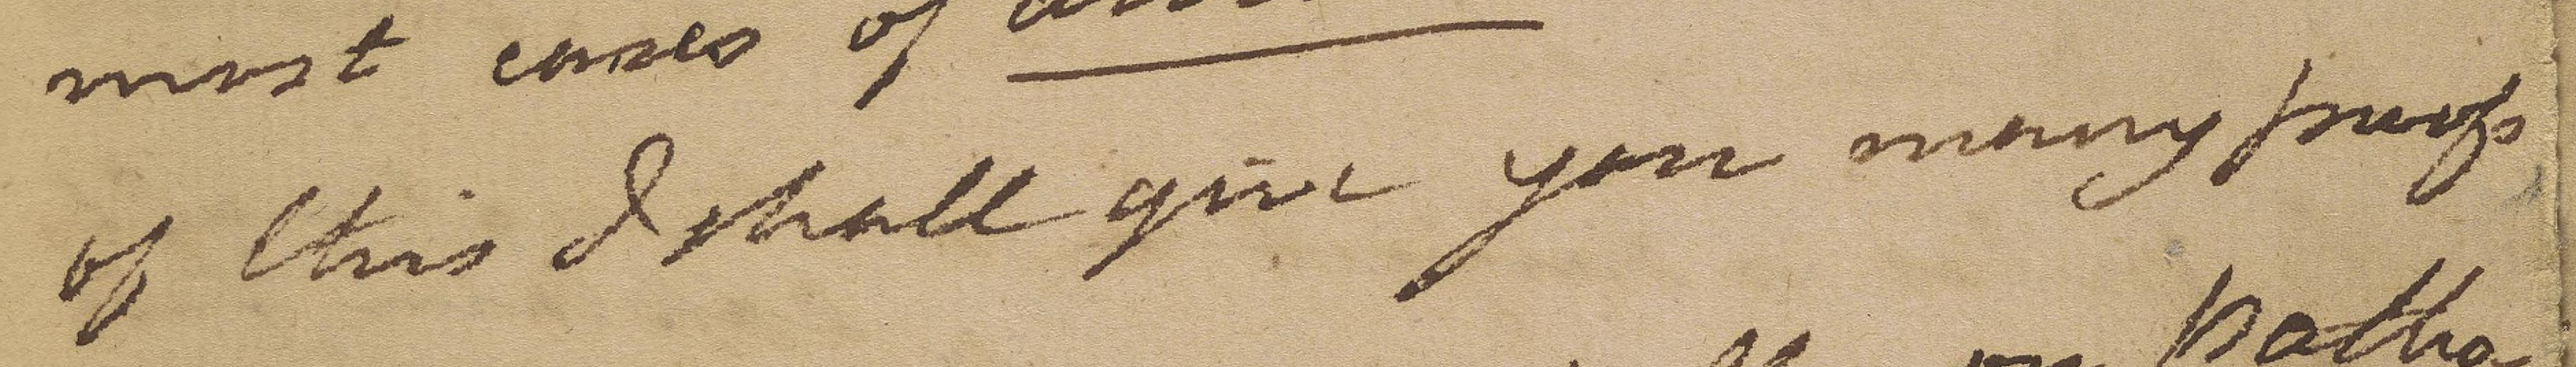of this I shall give you many proofs
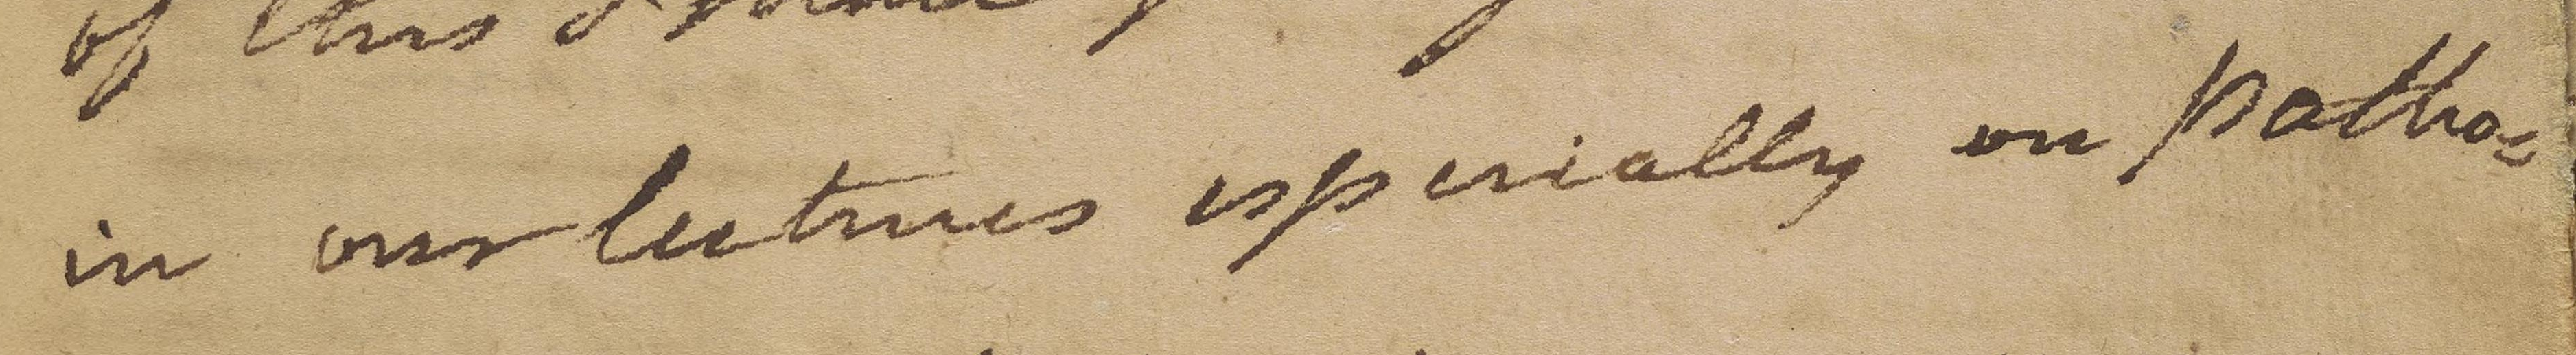in our lectures especially on patho-
